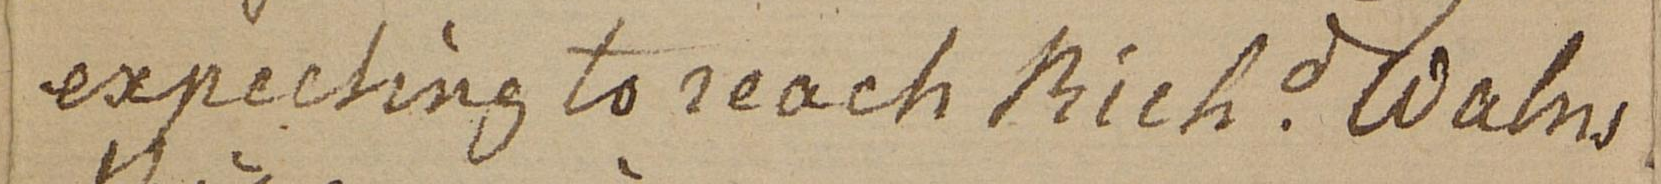expecting to reach Rich^d. Walns
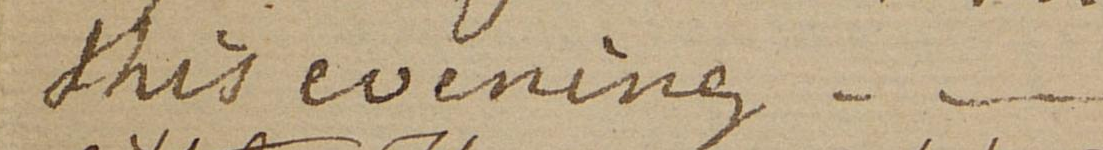this evening- -
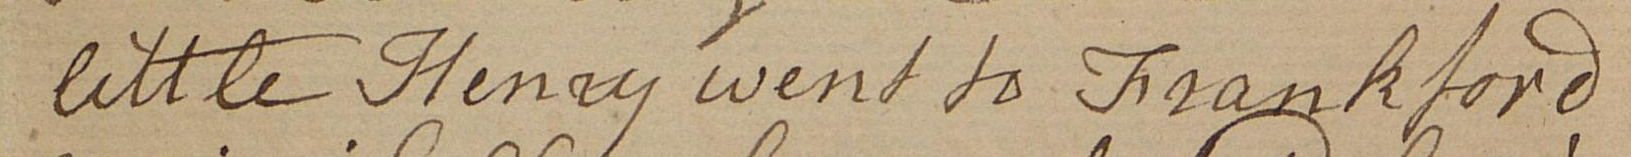little Henry went to Faankford
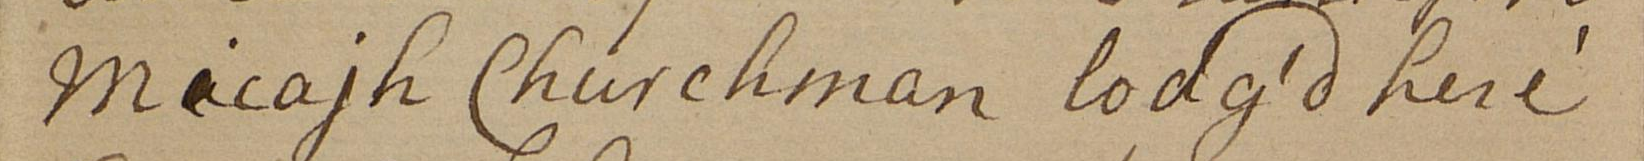Micajh Churchman lodg'd here
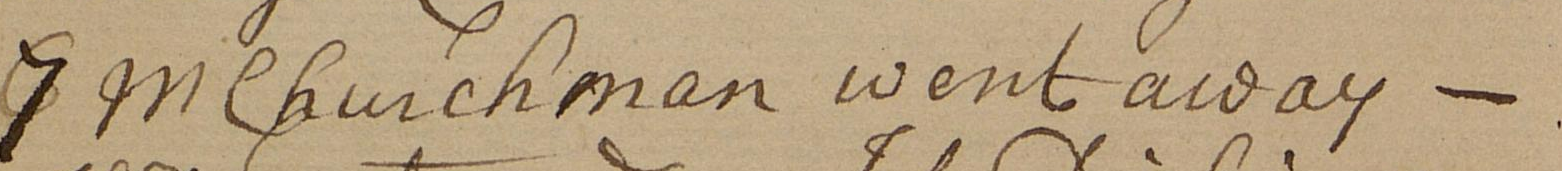7 M Churchman went away-
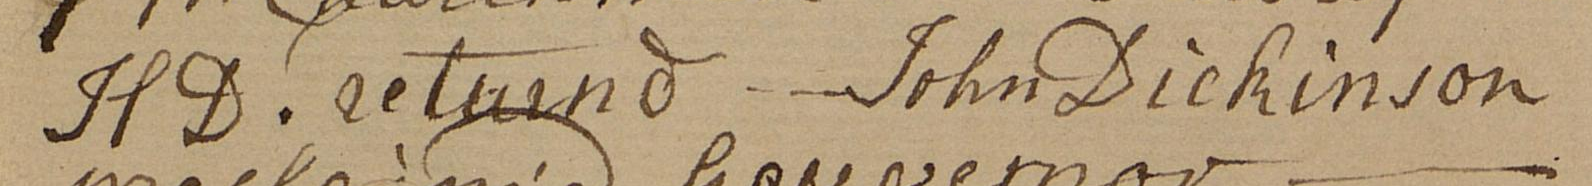HD. returnd-- John Dickinson
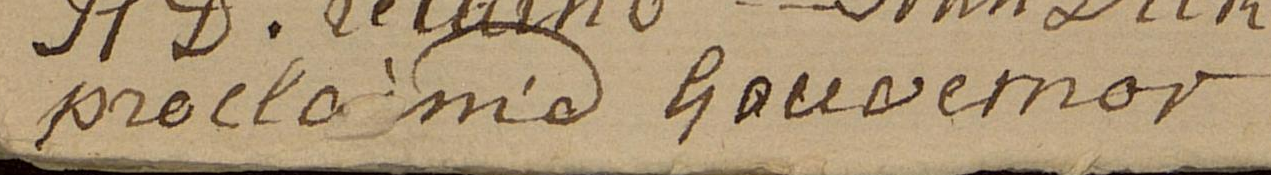proclaim'd Gouvernor
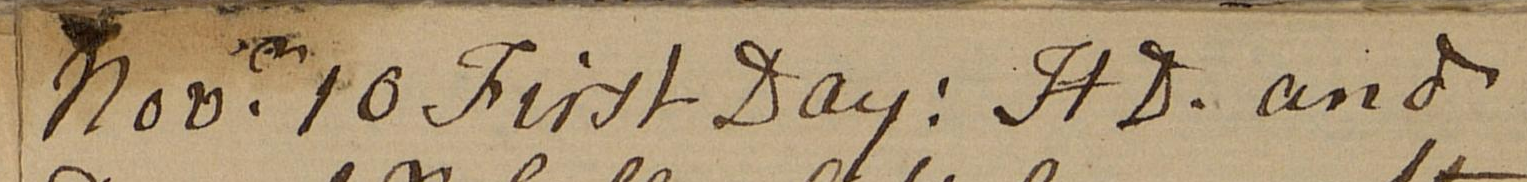Nov^r. 10 First Day: HD. and
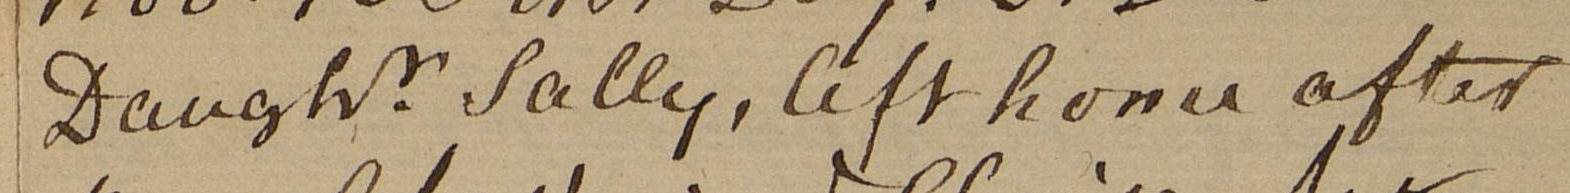Daugh^r. Sally, lift home after
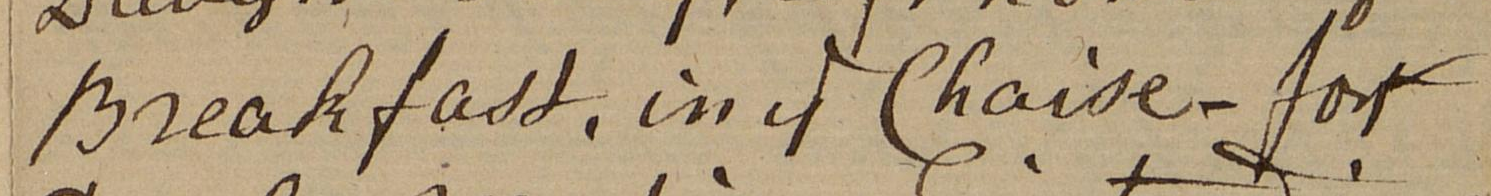Breakfast, in y^e Chaise- for
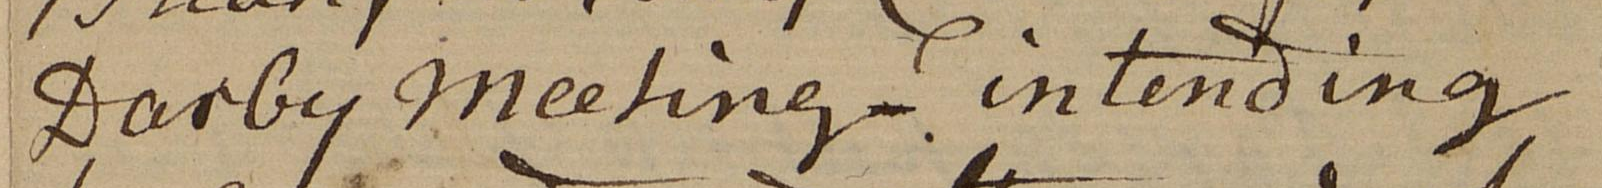Darby meeting,- intending
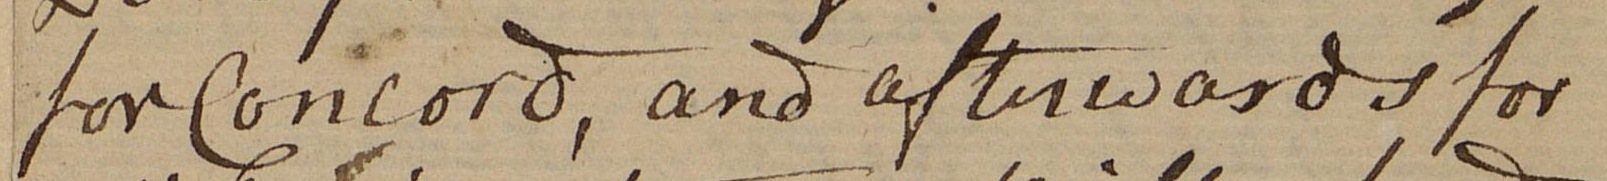for Concord, and afterwards for
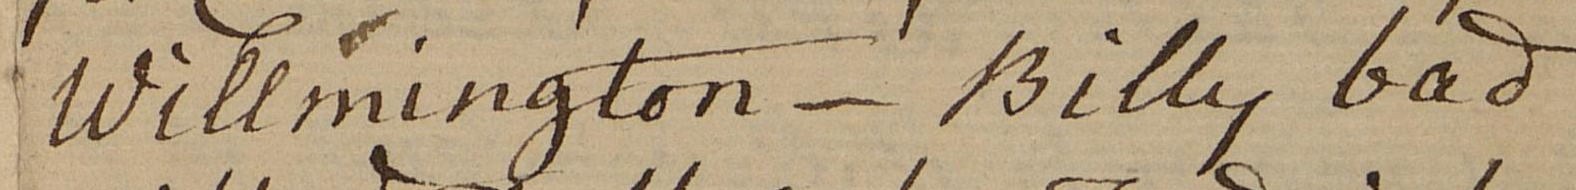Willmington- Billy bad
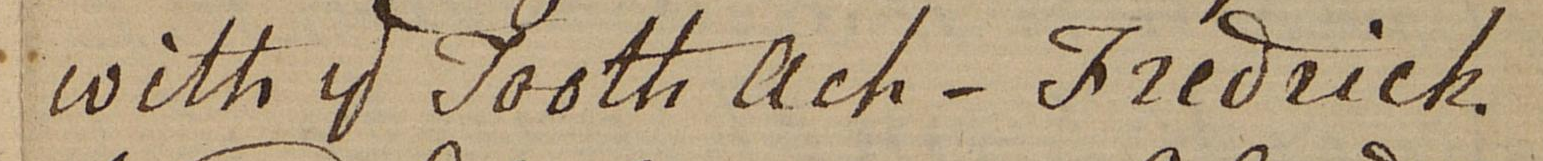with y^e Tooth ach- Fredrick
